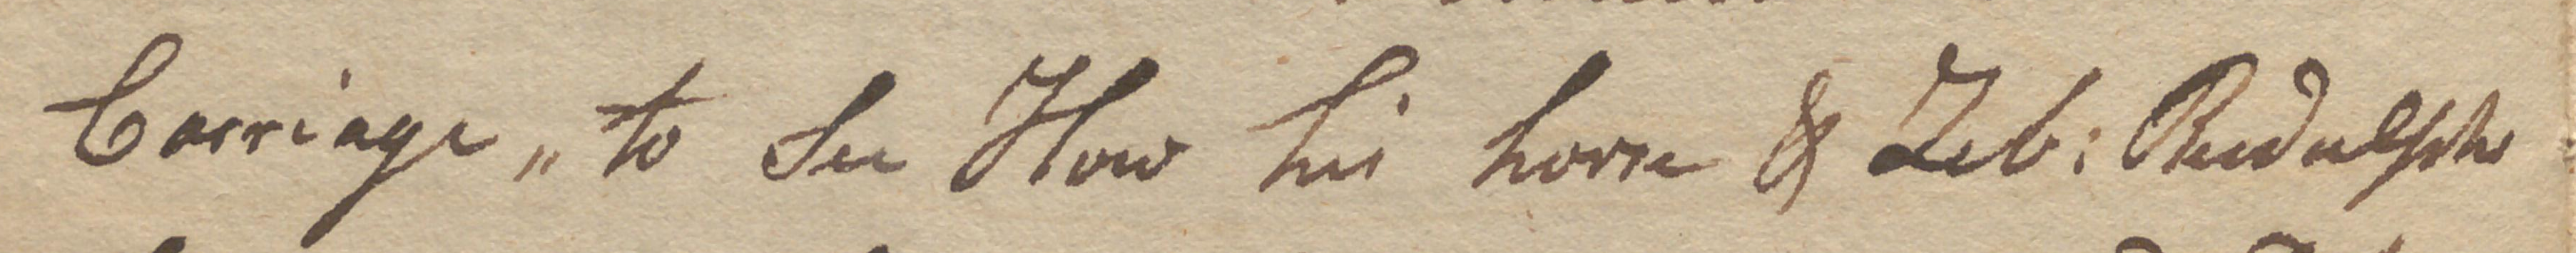Carriage, to see How his horse & Zeb. Rudulph
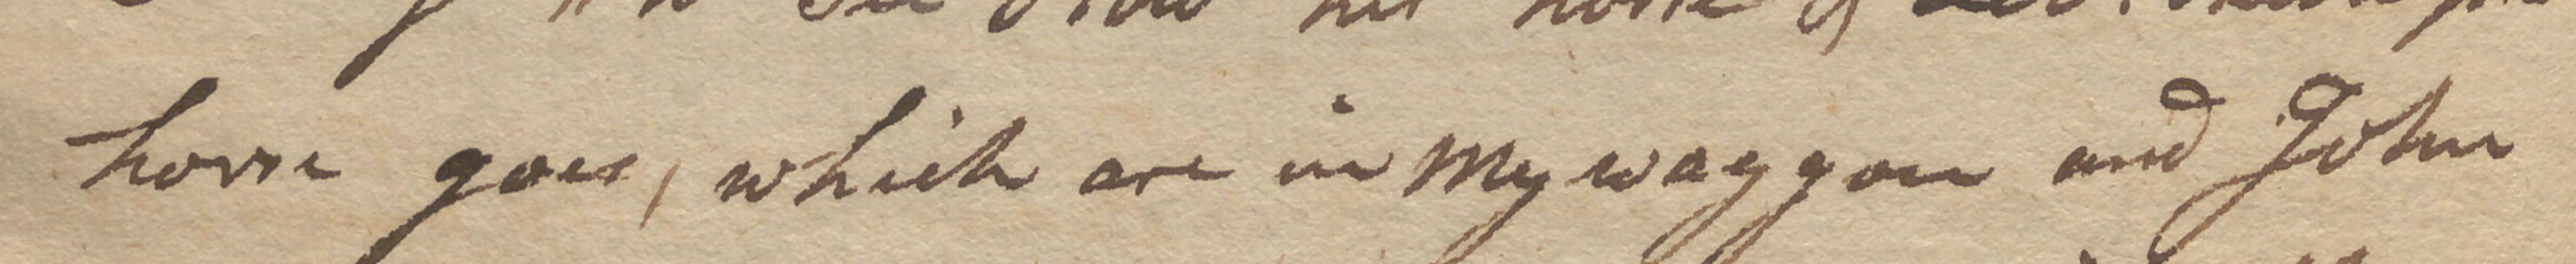horse goes, which are in My waggon and John
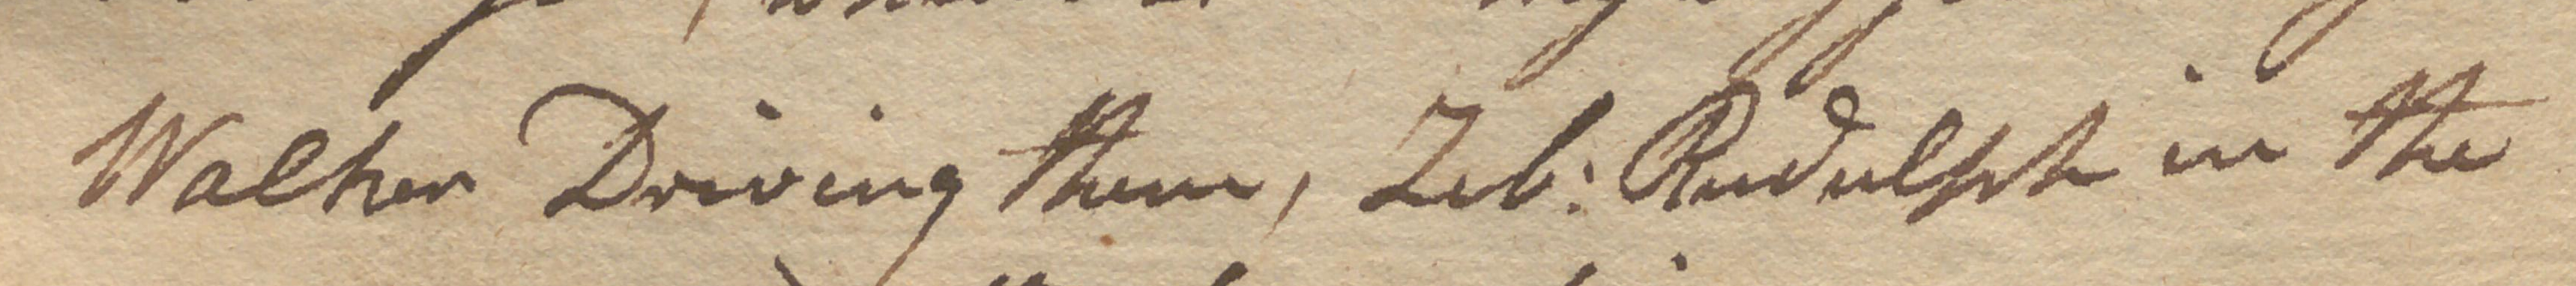Walker Driving them, Zeb. Rudulph in the
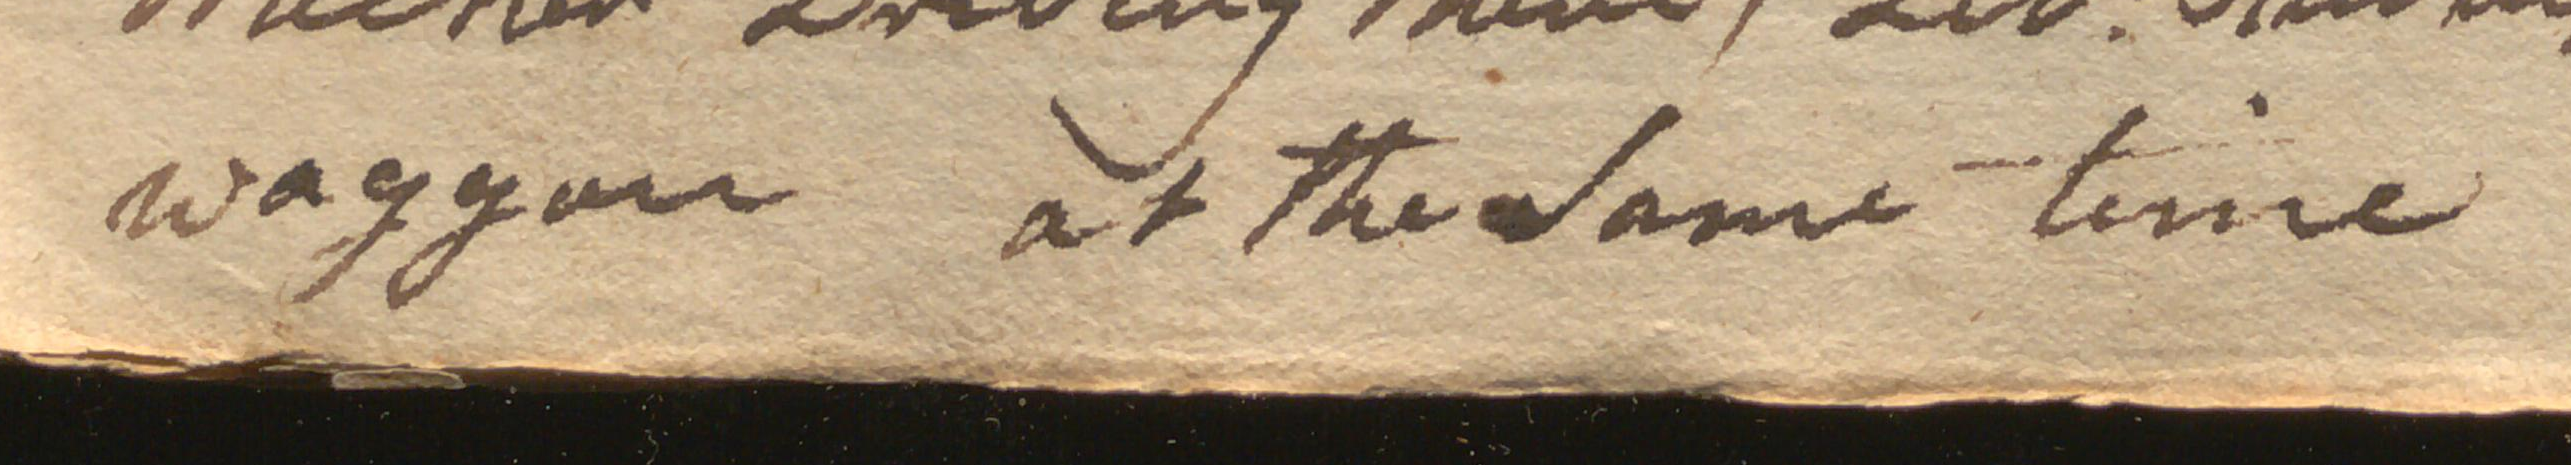waggon at the Same time
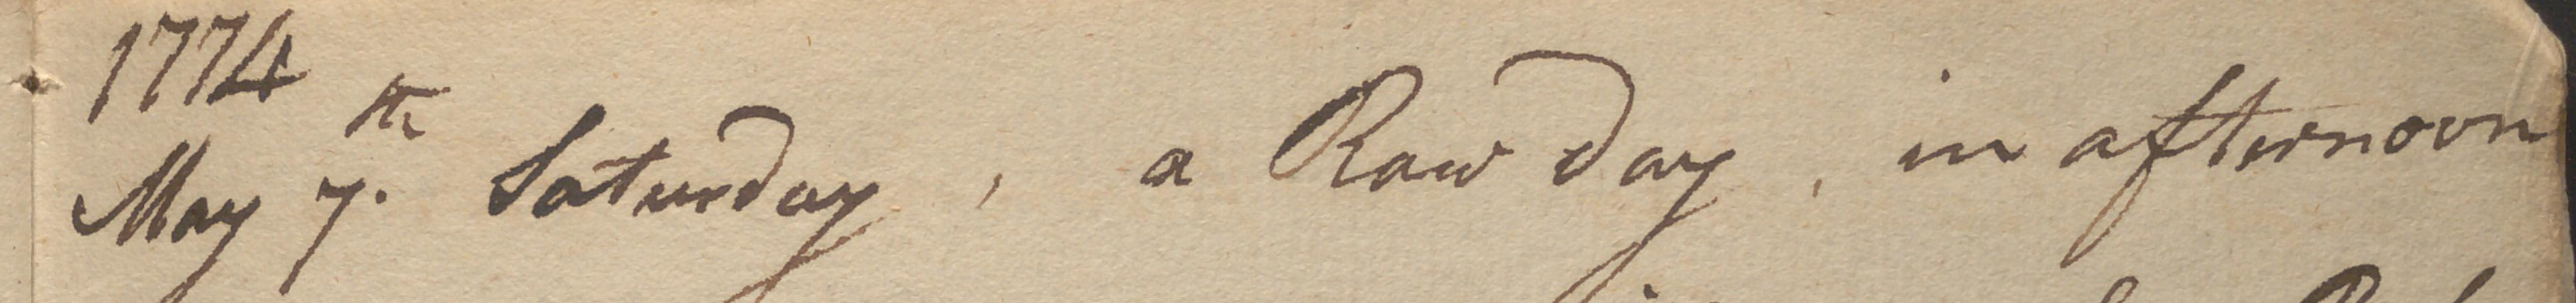May 7^th. Saturday, a Raw day in afternoon
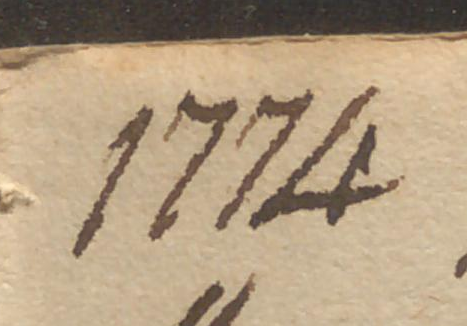1774
